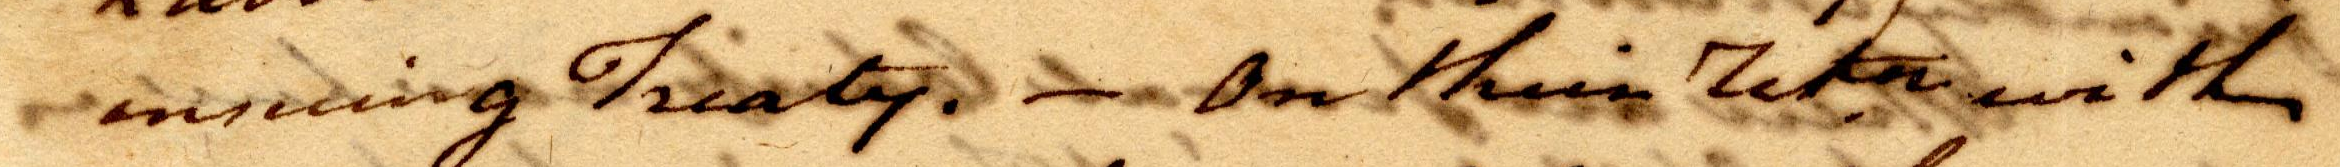insuing Treaty.- On their return with
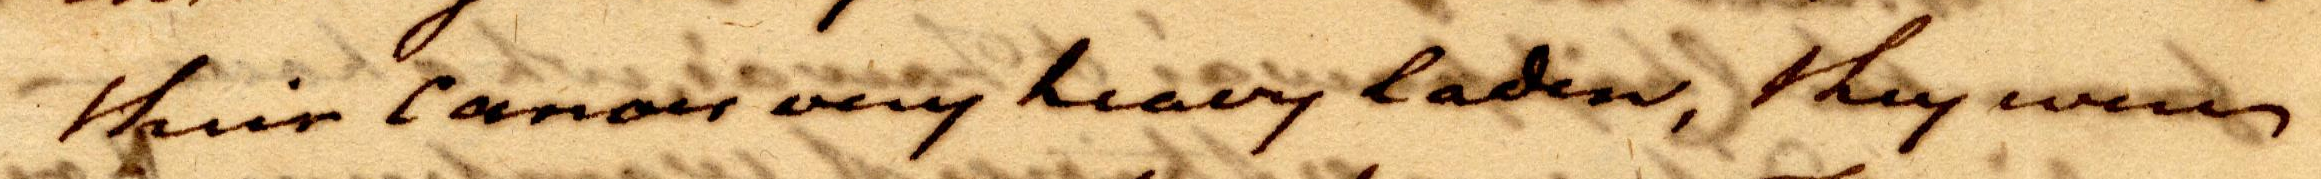their canoes very heavy laden, they were
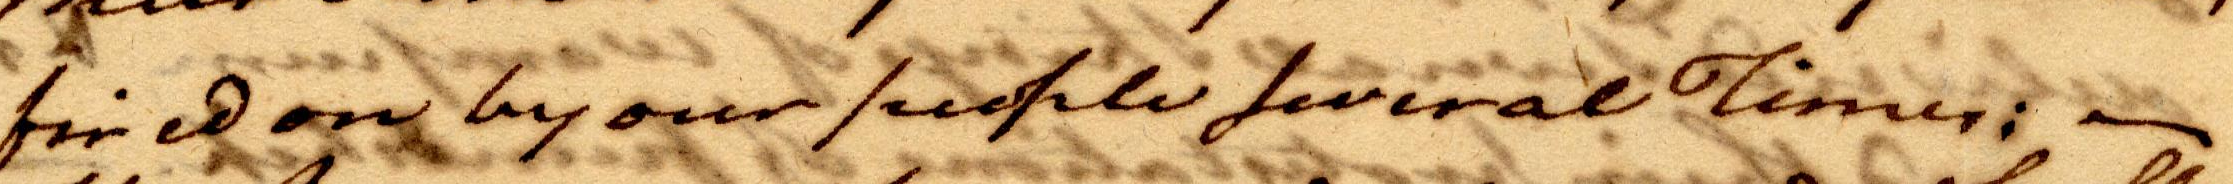fired on by our people several Times;-
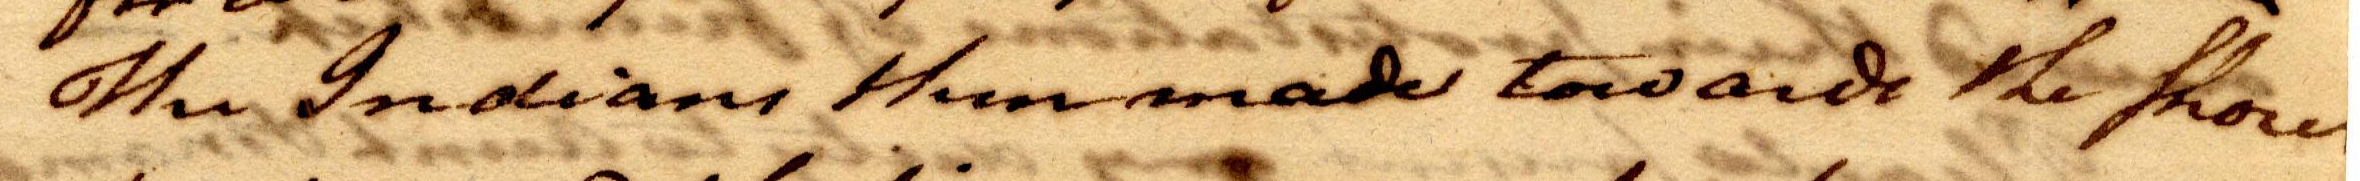The Indians then made towards the Shore
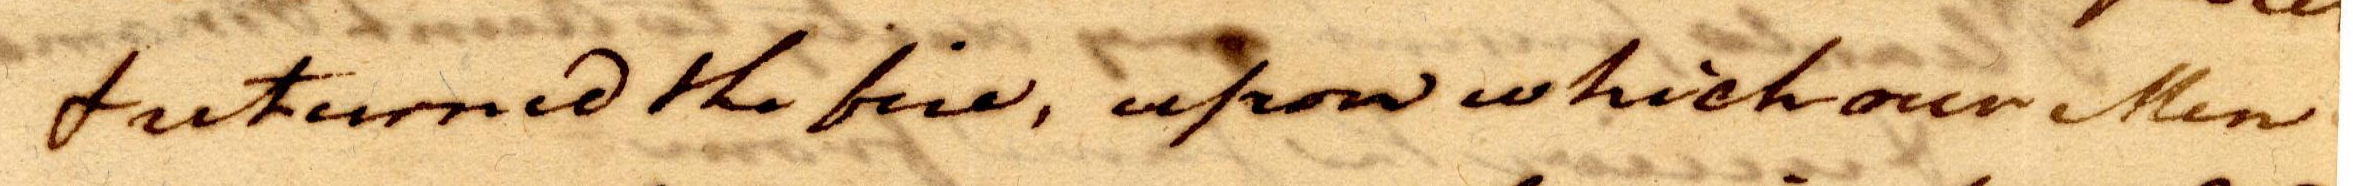& returned the fire, upon which our Men
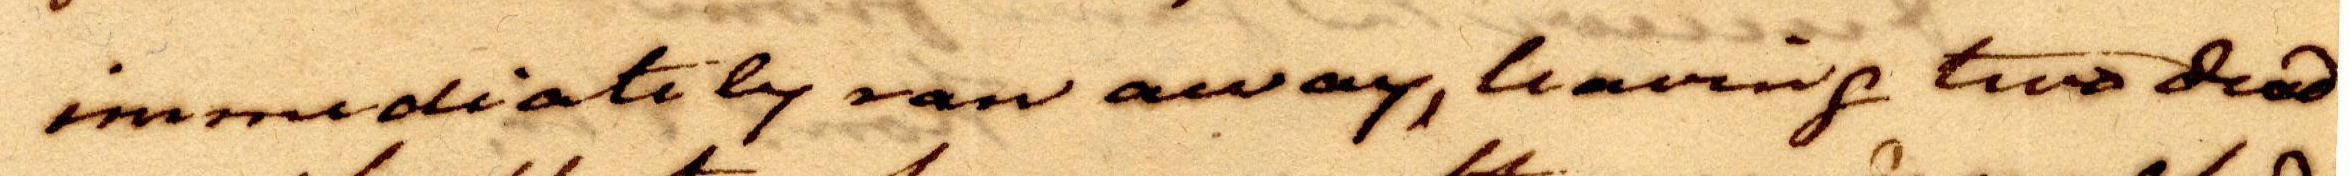immediately ran away, leaving two dead,
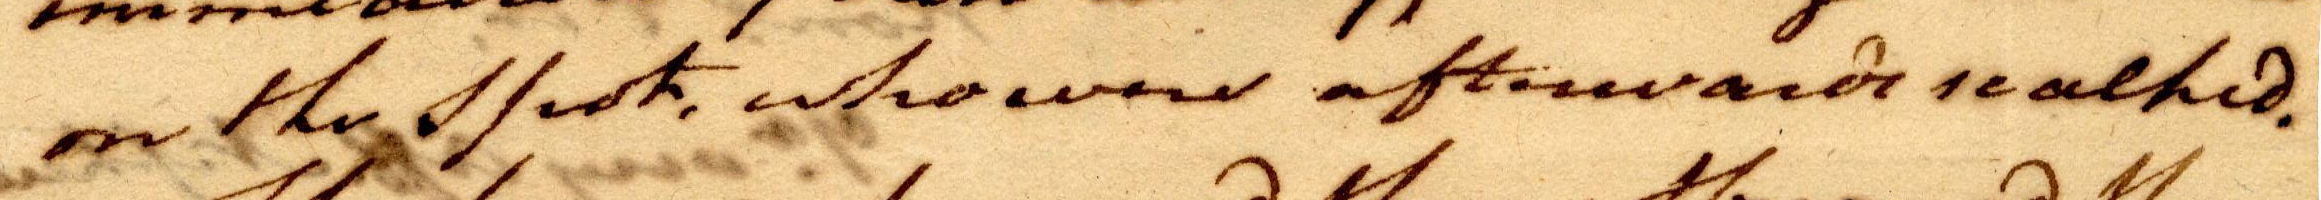on the Spot, who were afterwards scalped.
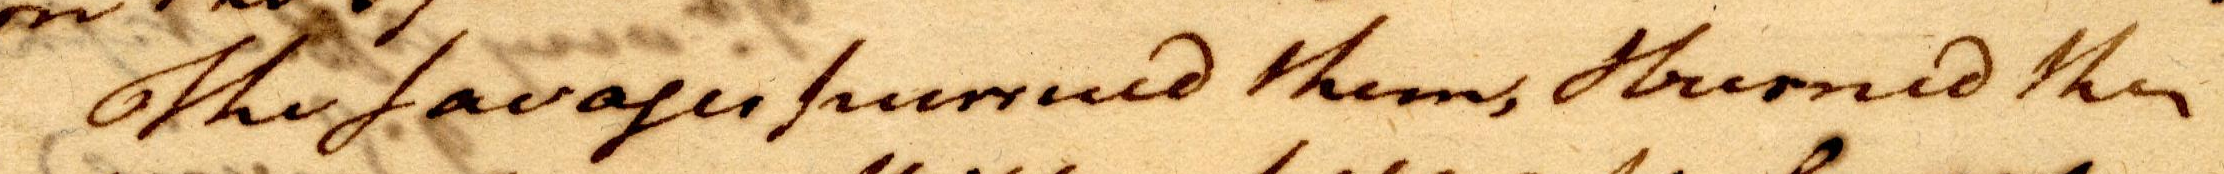The Savages pursued them, & burned the
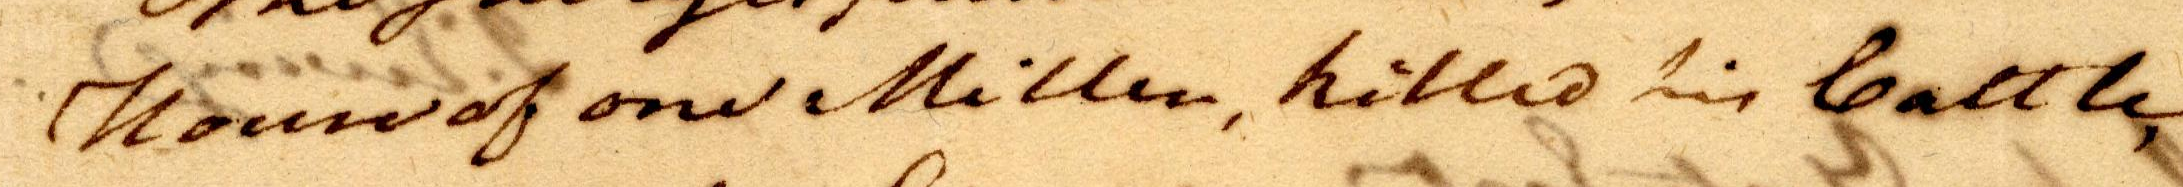House of one Miller, killed his Cattle,
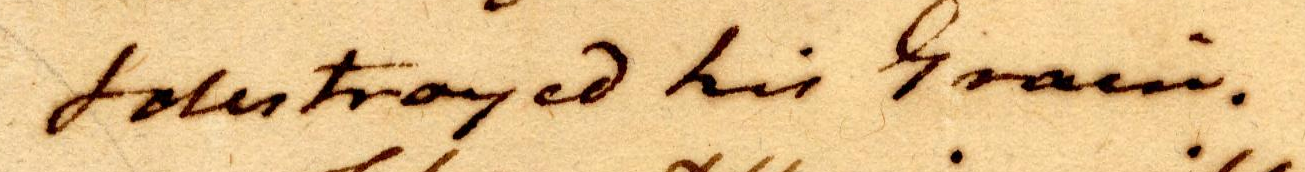& destroyed his Grain.
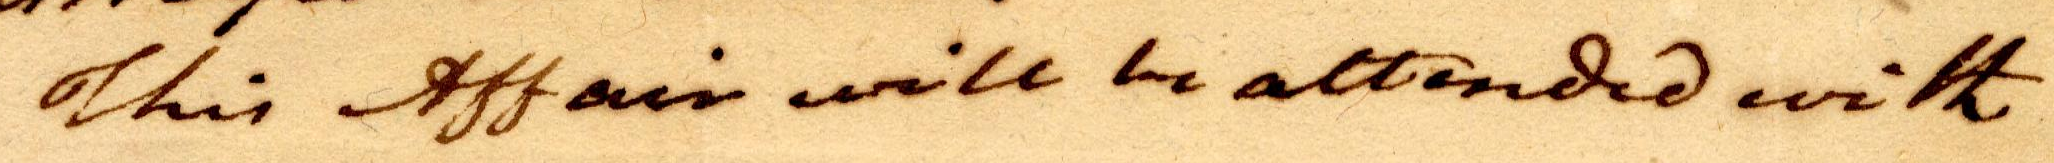This Affair will be attended with
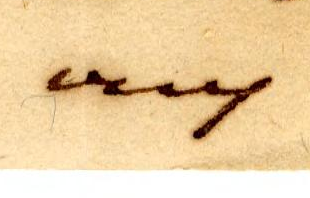every
